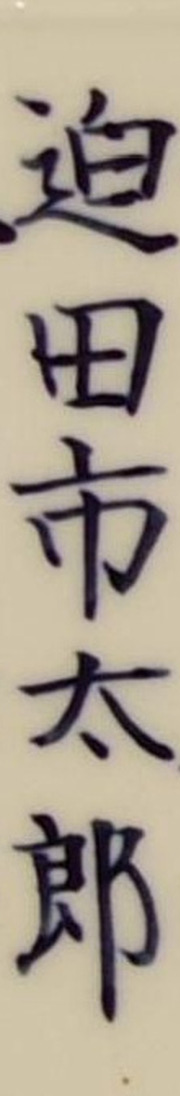迫田市太郎
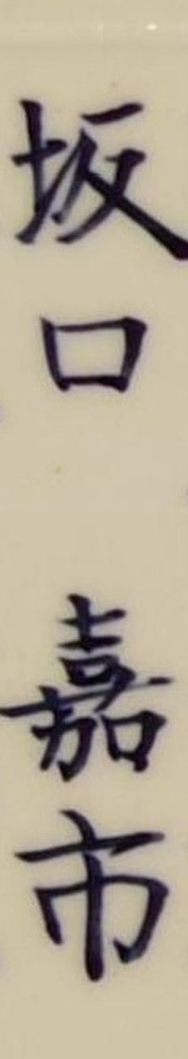坂口嘉市
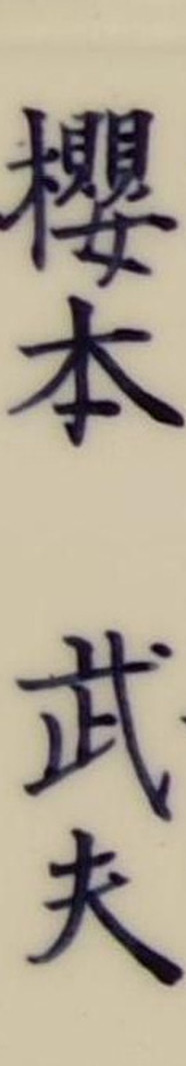桜本武夫
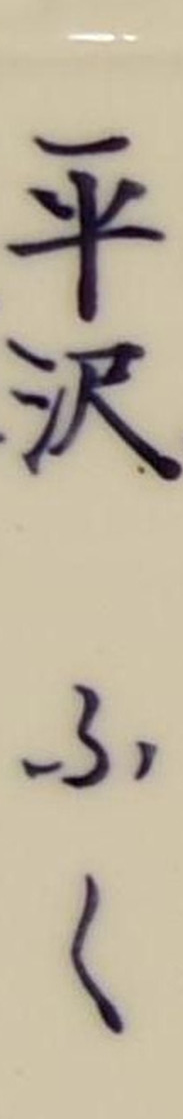平沢ふく

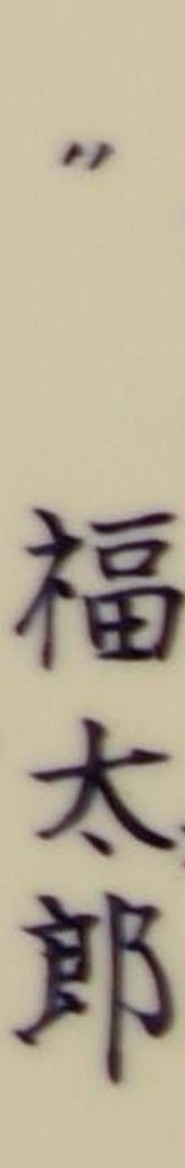福太郎
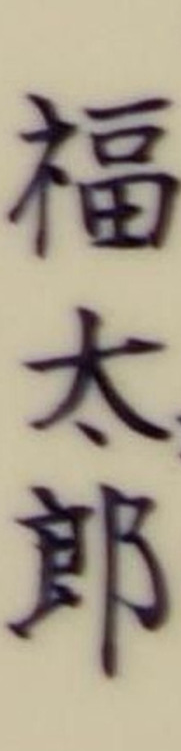福太郎
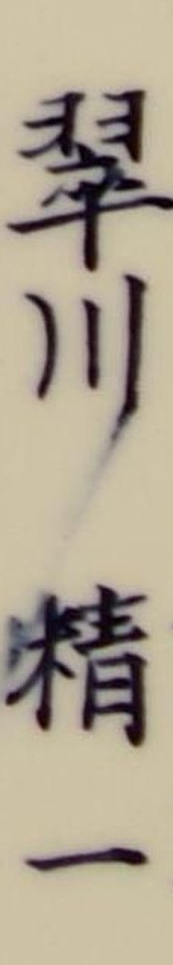翠川精一
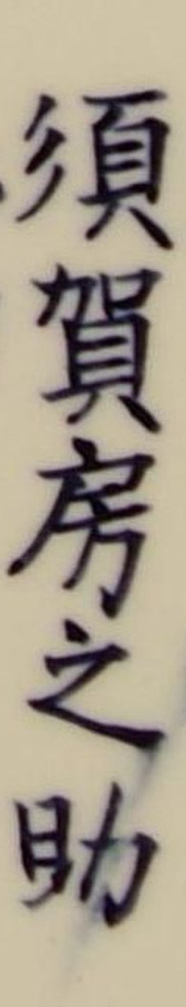須賀房之助
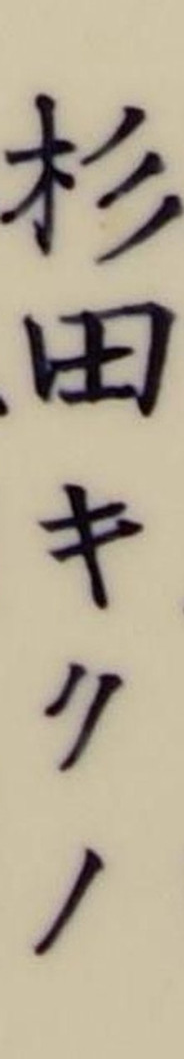杉田キクノ
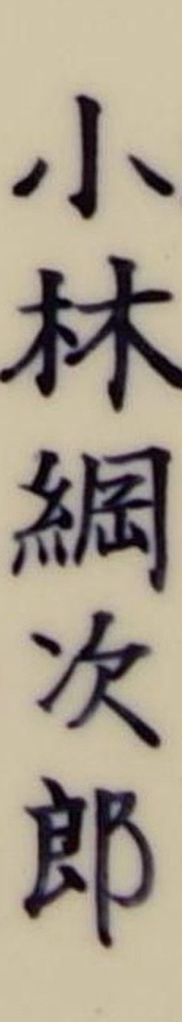小林綱次郎
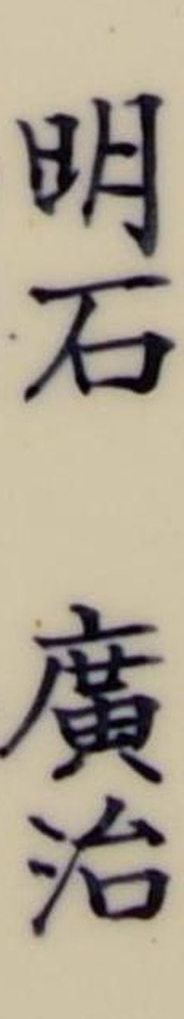明石廣治
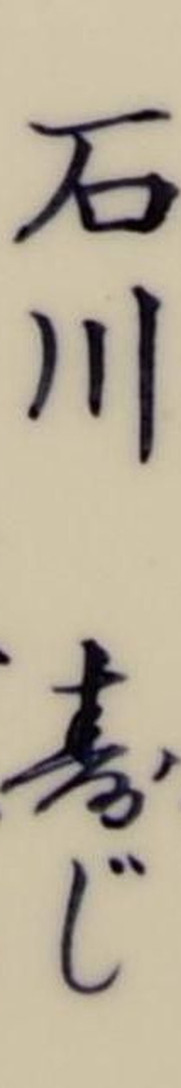石川すじ
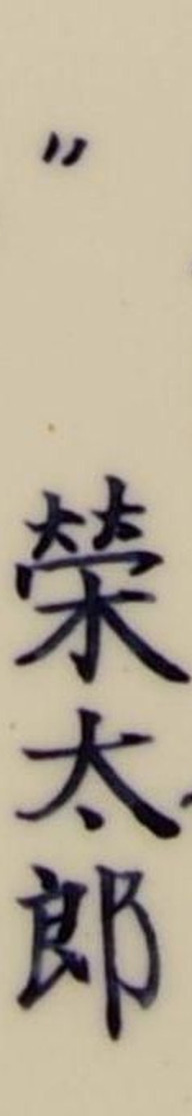福太郎
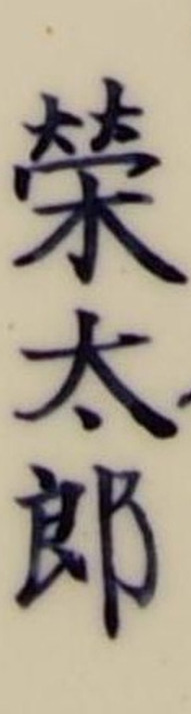福太郎
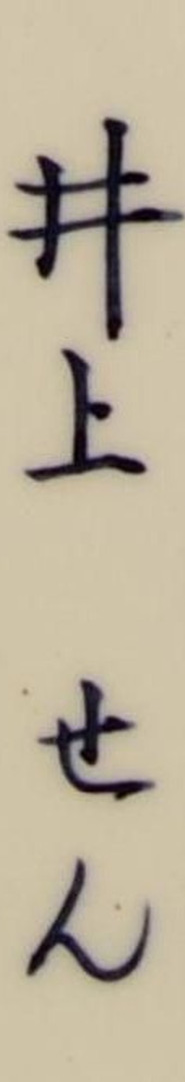井上せん
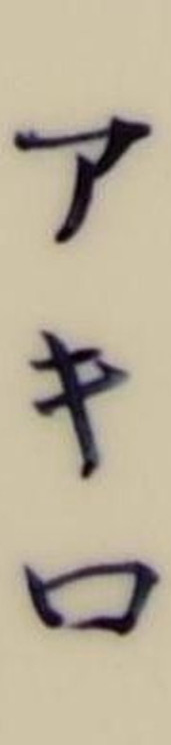アキロ
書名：E~L
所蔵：高野山金剛峯寺
